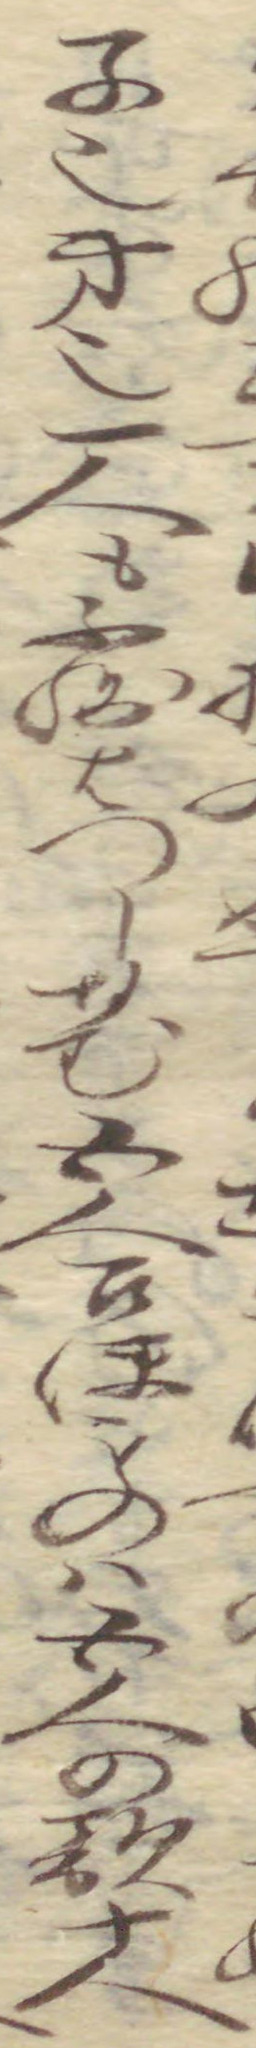子也弟也一人も不残はつしなむ五人召使ものは五人の敵十人
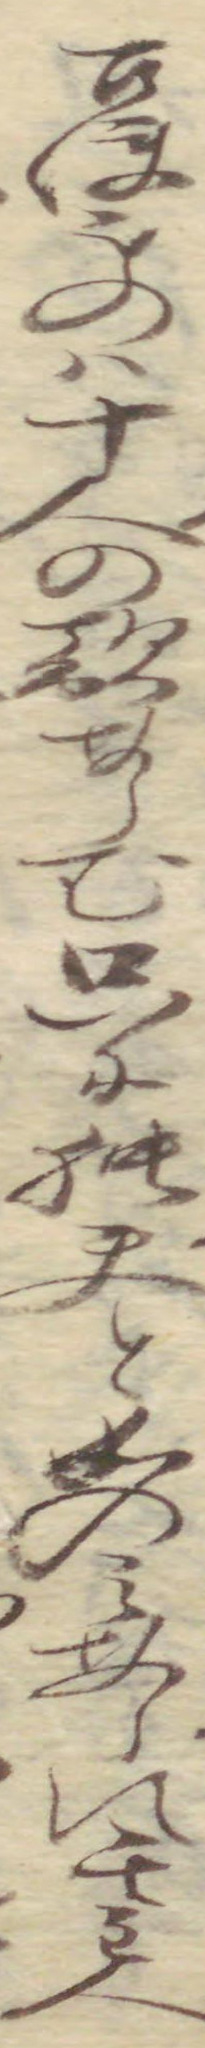召使ものは十人の敵ならむ只に独夫と成のみならす其主人
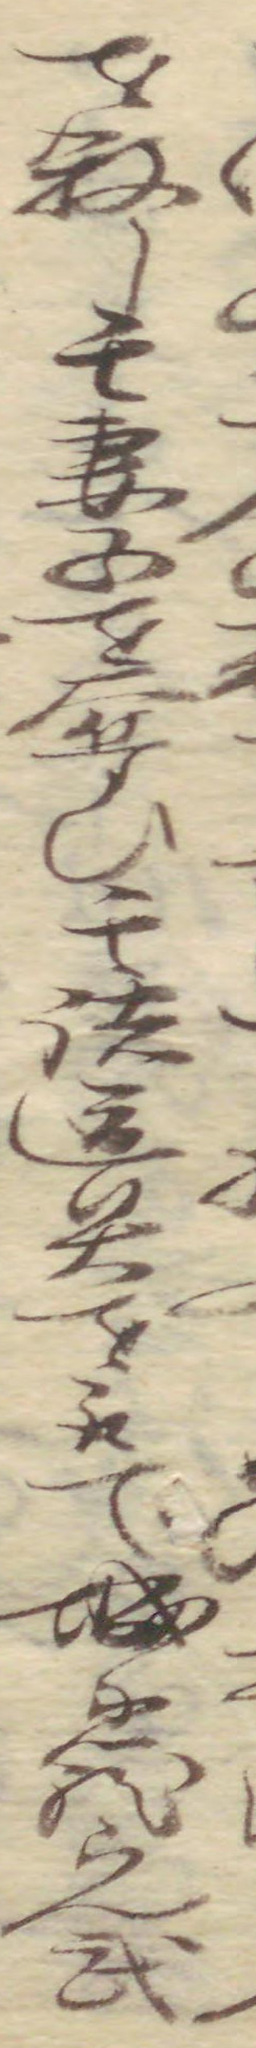を殺し其妻子を奪ひ其諸道具を取て城に籠らん武
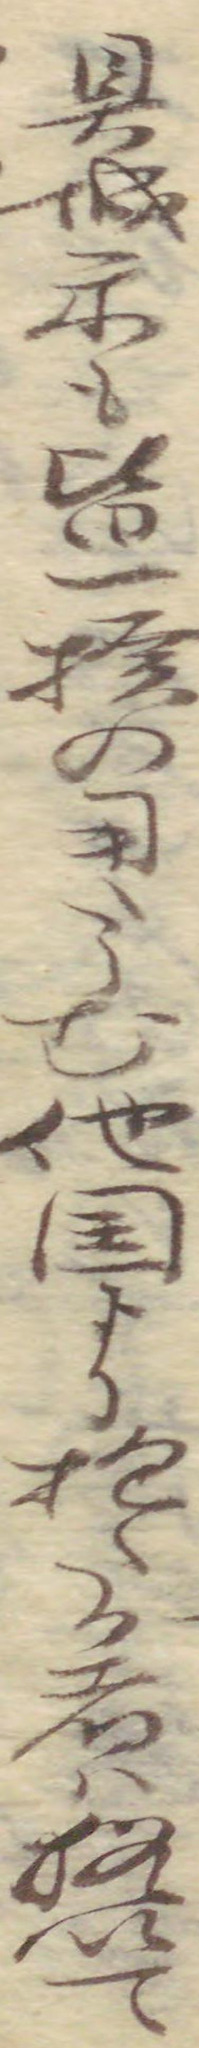具城米も皆一揆の用たらむ他国より抱たる者は猶以て
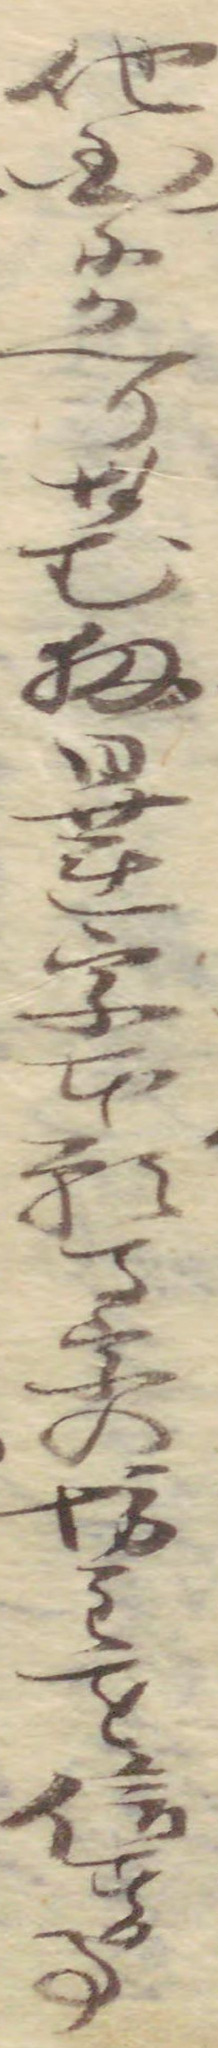他国にかへりなむ扨日蓮宗本願寺宗の坊主を信する事
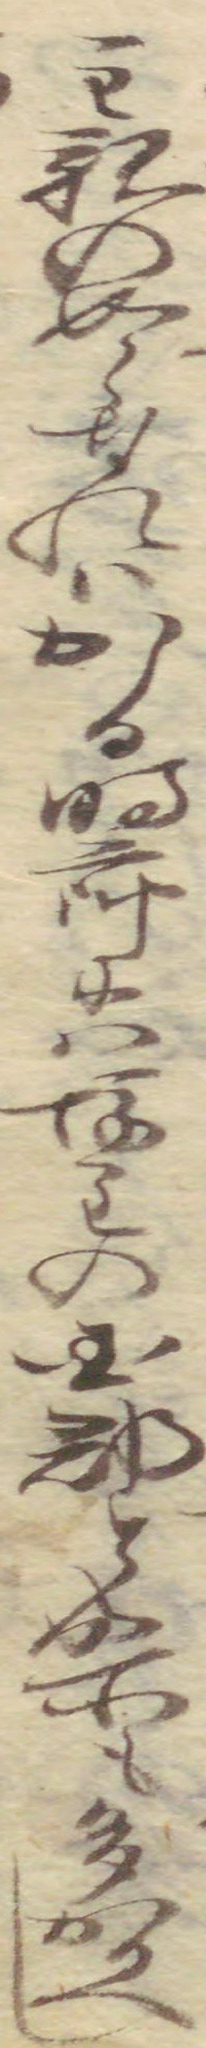主親の如くなれはかゝる時節には坊主の国郡と成所も多かるへし
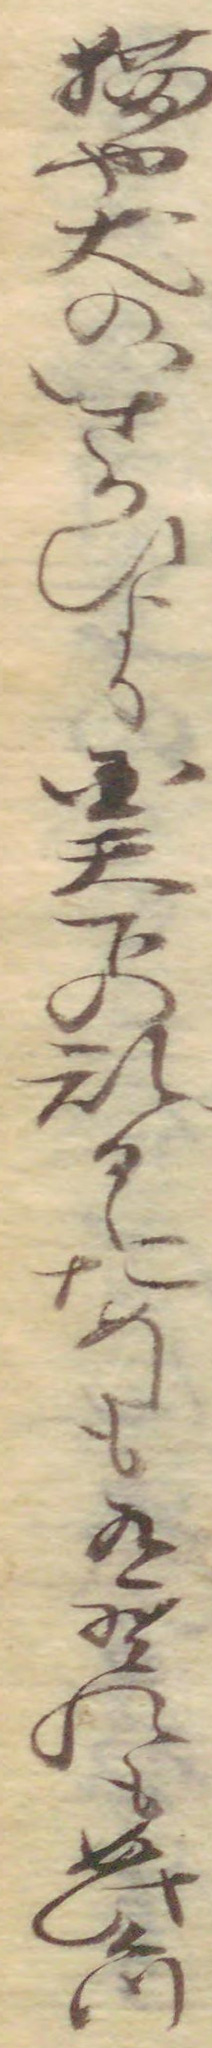猫や犬のいさかひより国天下の乱るゝためしも有それも如此くつ

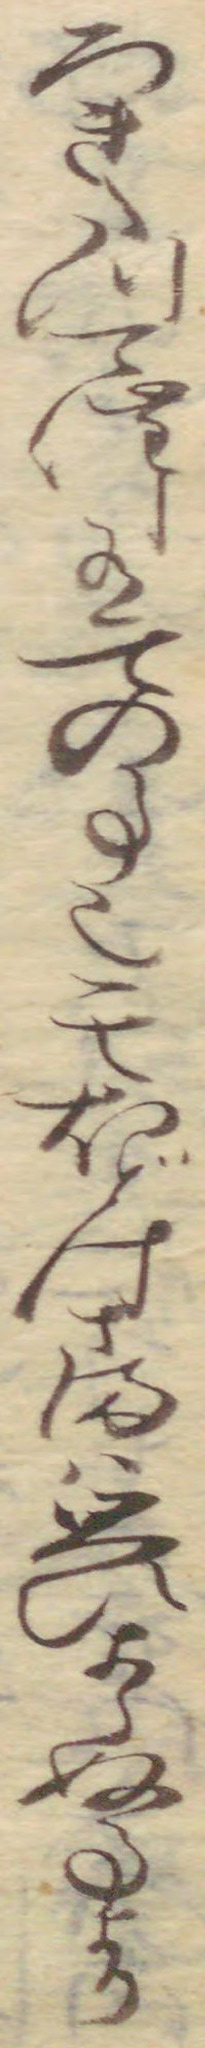ろきたつて催し有ての事也其ほどけさまは思ひよらぬ事より
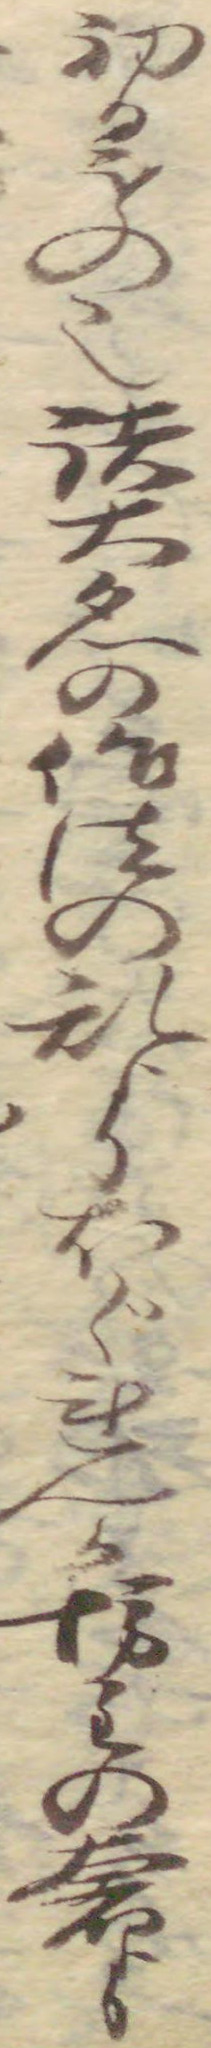初るもの也諸大名の作法の乱よりほぐれんか坊主の奢より
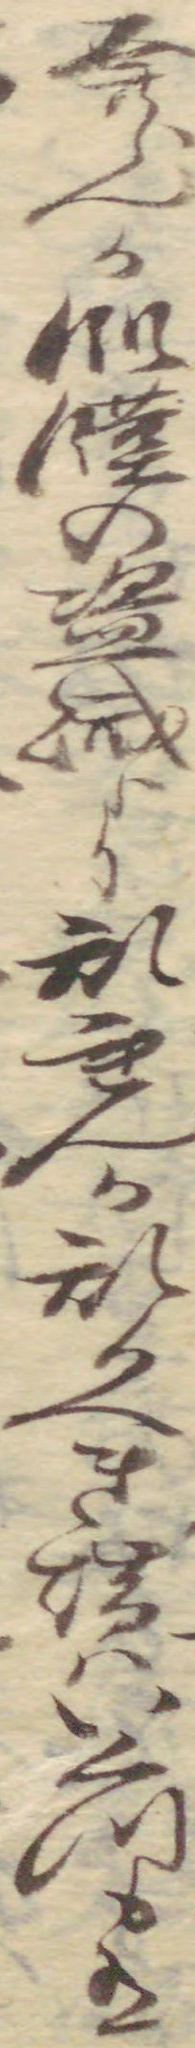発らんか飢饉の盗賊より乱れんか乱るへき端はいくつも有
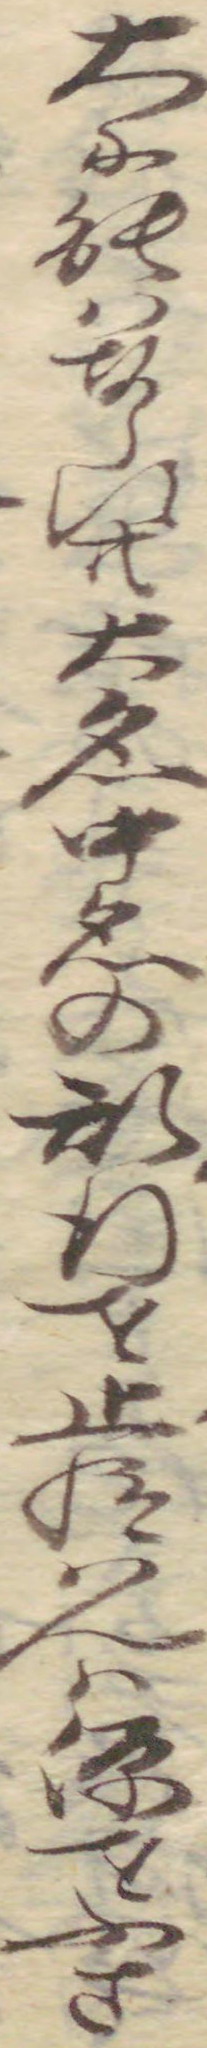大に能はならす共大名中名の乱行を止給はんは源をふさ
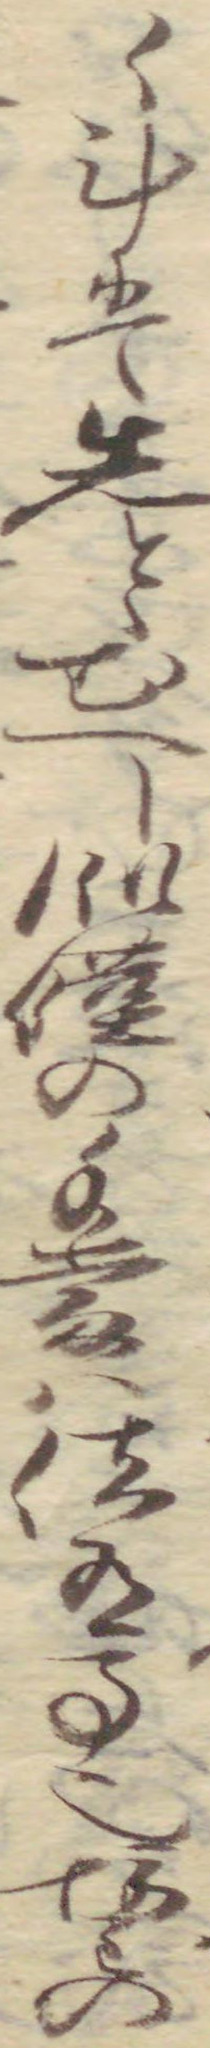く計にて先とゝむへし飢饉の手当は法有事也坊主の
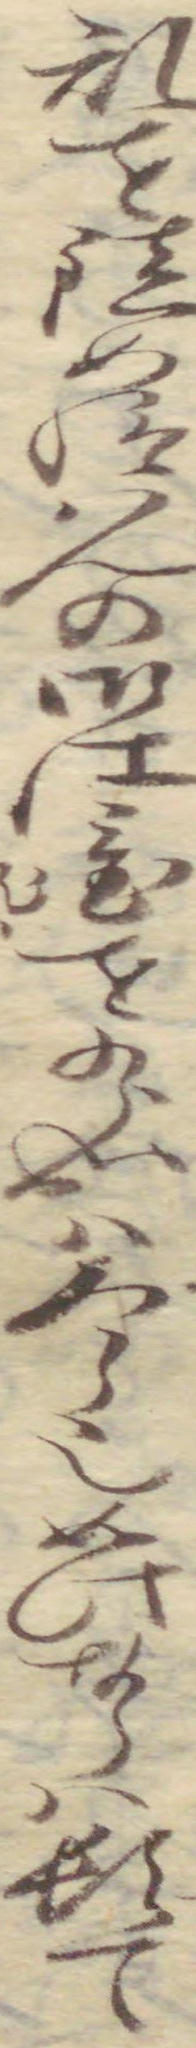乱を鎮め給はんの御仕置を可被成は今也如此ならは頓て
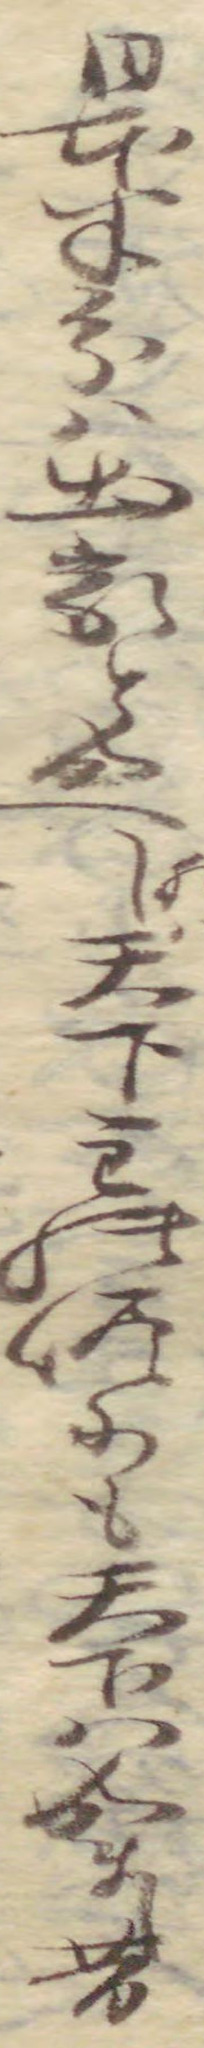日本半分は出家と成へし然は天下主の侭にも天下は成まし昔
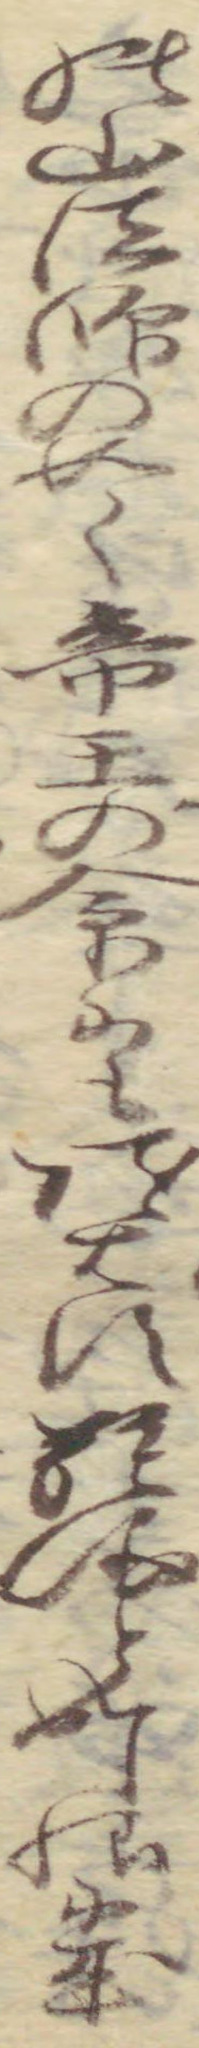の山法師の如く帝王の命にも随はす難儀被成し様に成
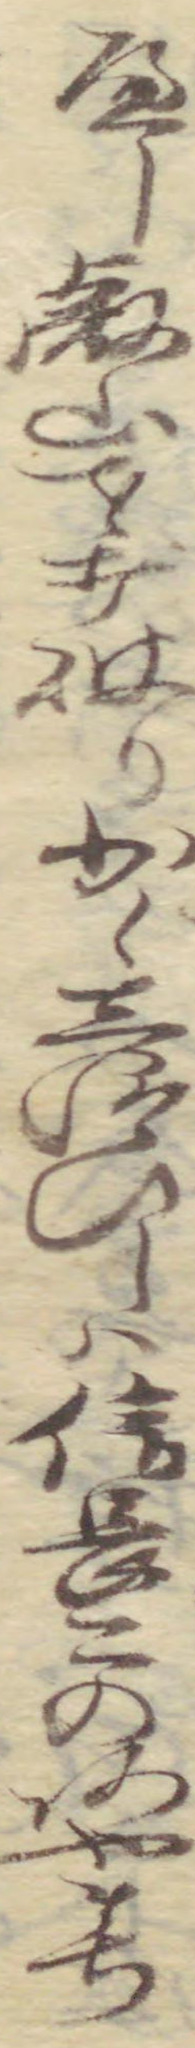へし叡山を打破り少くし給ひしは信長公のあやまち
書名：鶯宿雑記. 巻263-264
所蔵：国立国会図書館 National Diet Library, JAPAN
